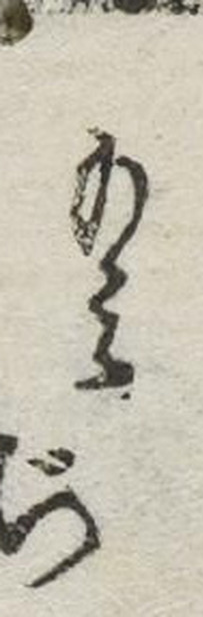もみぢ
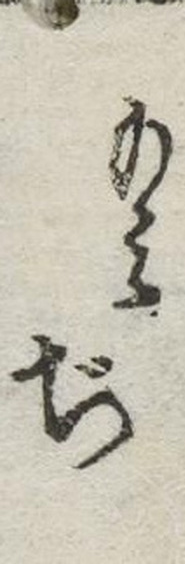もみぢ
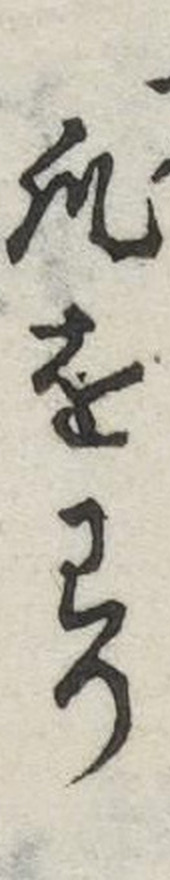爪をわり
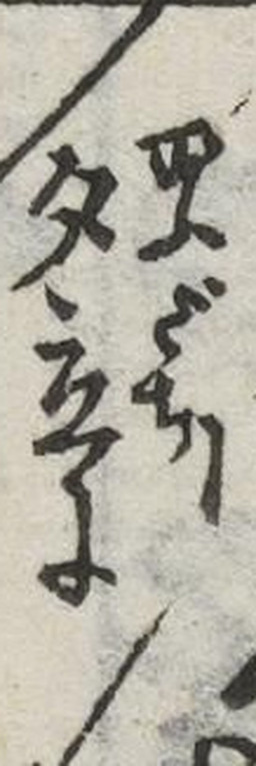夕立に
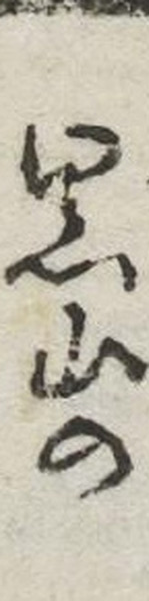黒山の
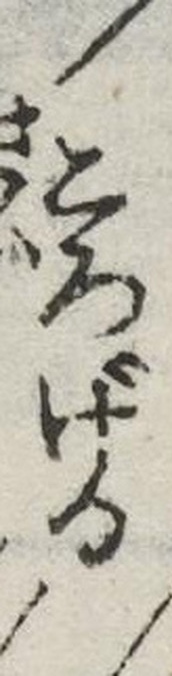ころげる
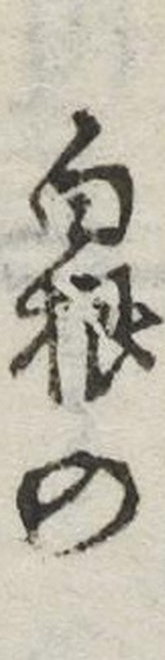白根の
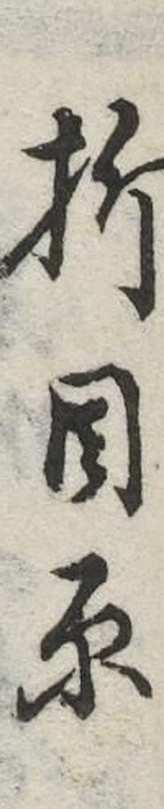折目原
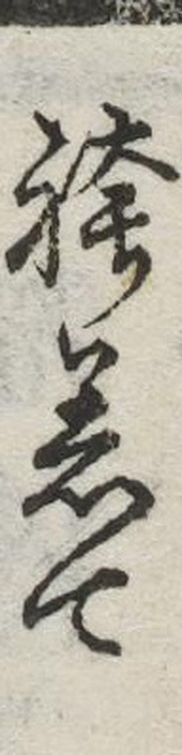袴着て
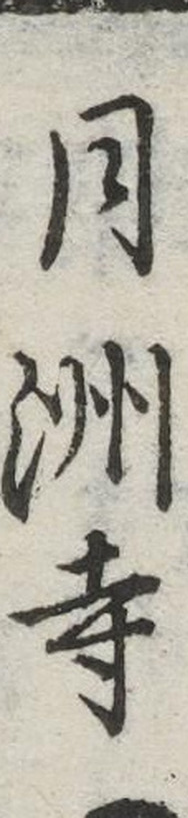月洲寺
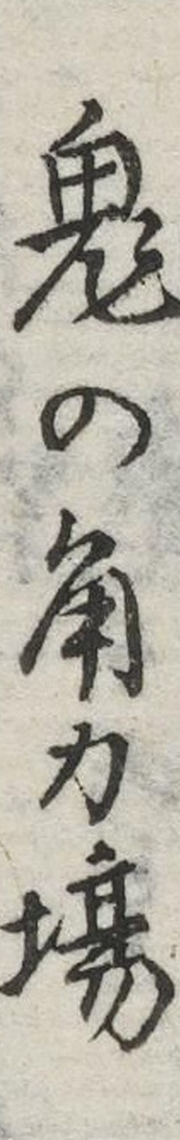鬼の角力場
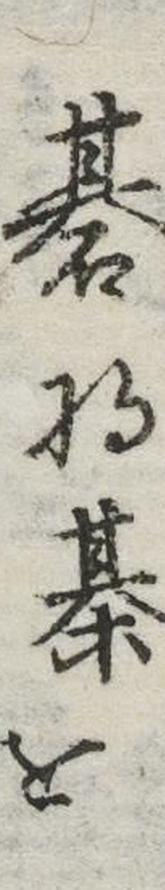碁将棋を
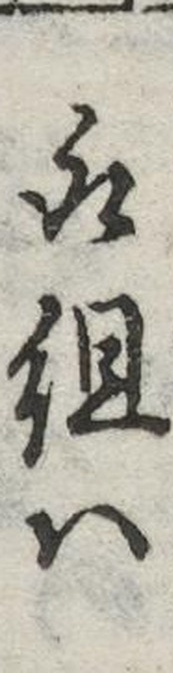取組は
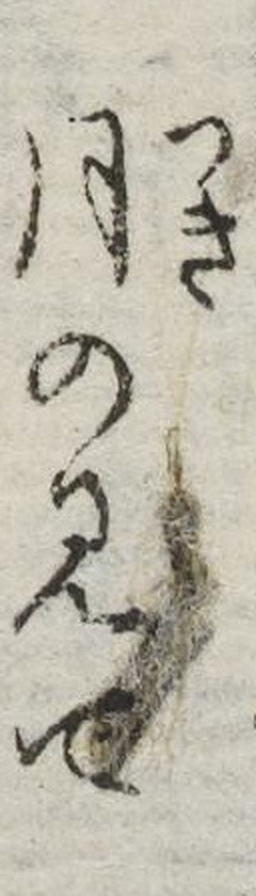月の見て
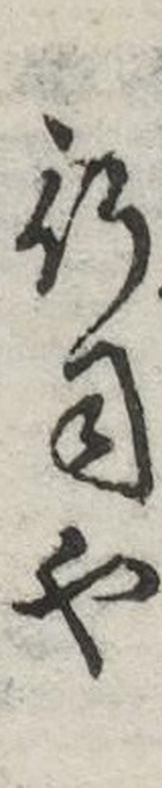行司や
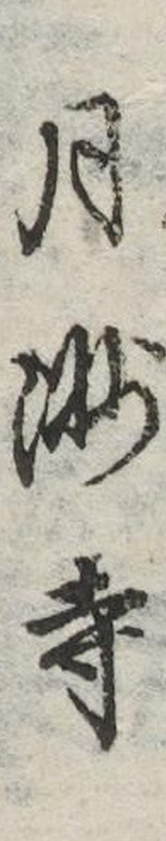月洲寺
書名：諸國温泉遊覽記　全
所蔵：東京大学地震研究所図書室 Earthquake Research Institute Library, The University of Tokyo, JAPAN
